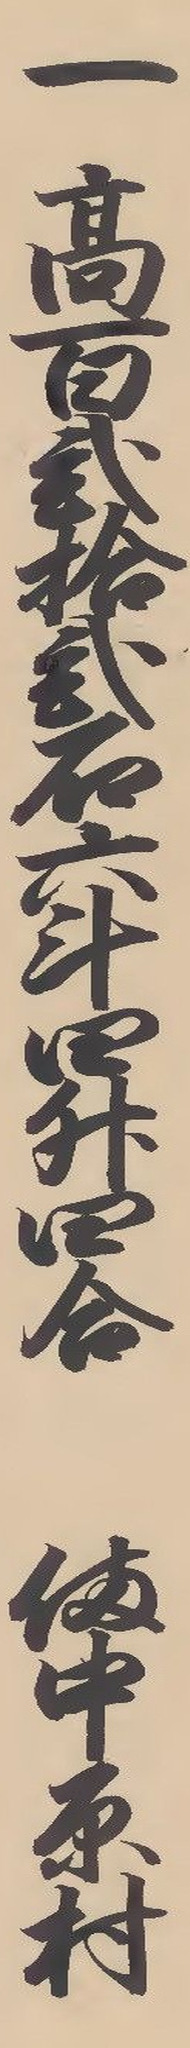一高百弐拾弐石六斗四升四合備中原村
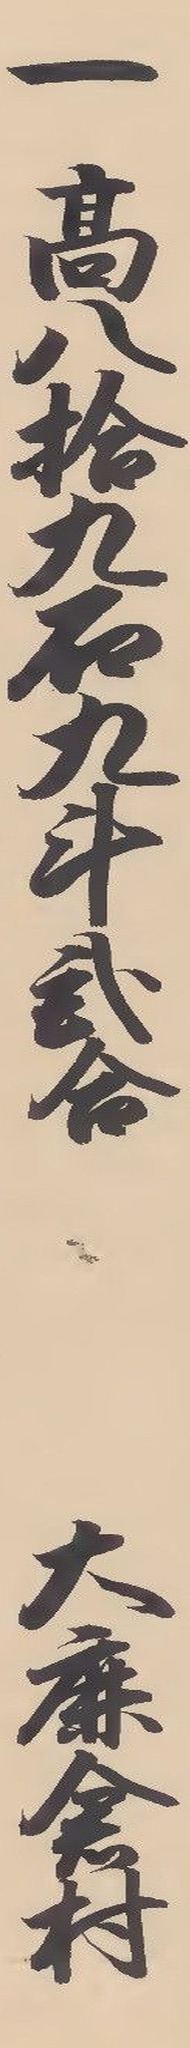一高八拾九石九斗弐合大鹿倉村
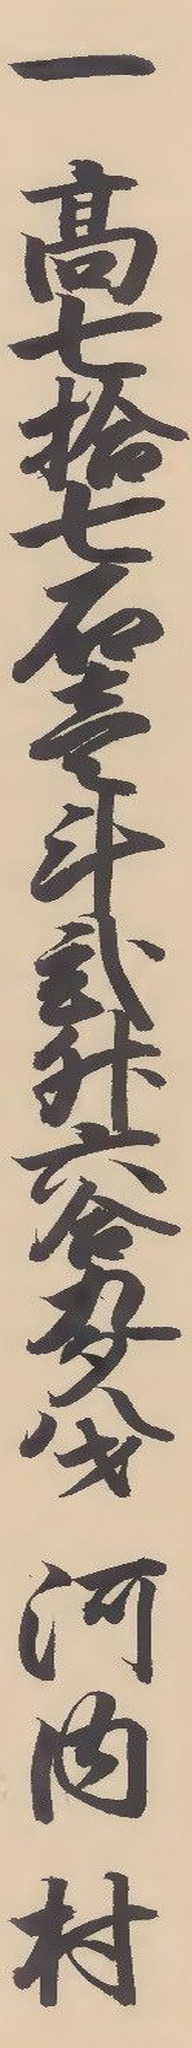一高七拾七石壱斗弐升六合九勺八才河内村
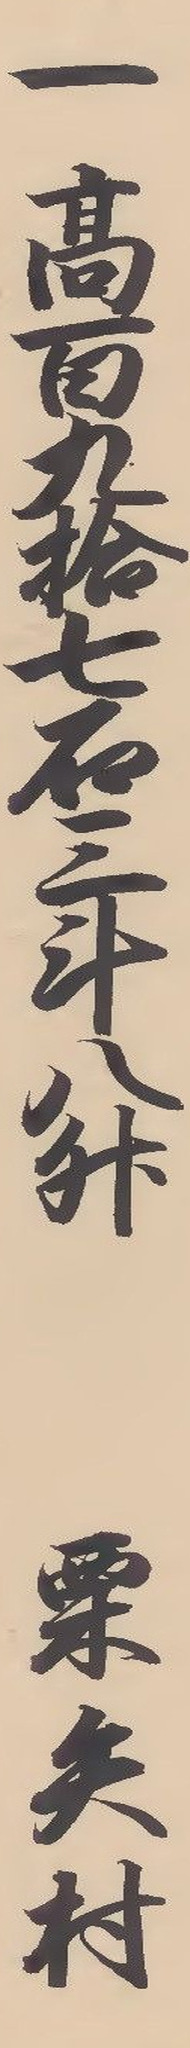一高百九拾七石三斗八升栗矢村
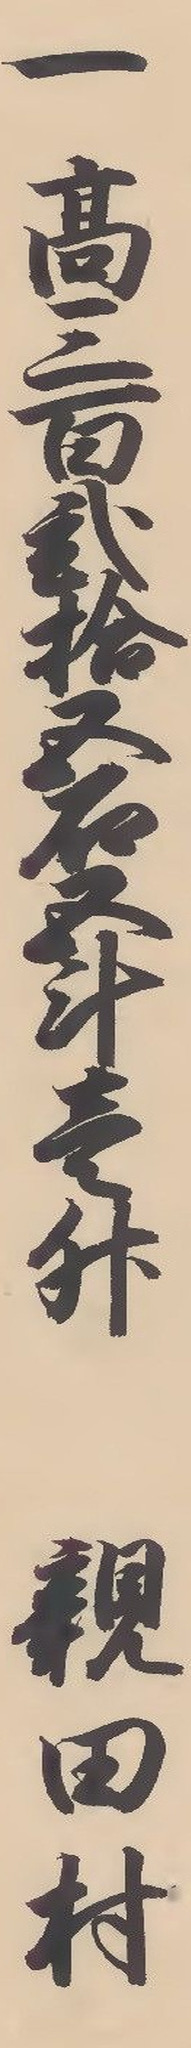一高三百弐拾五石五斗壱升親田村

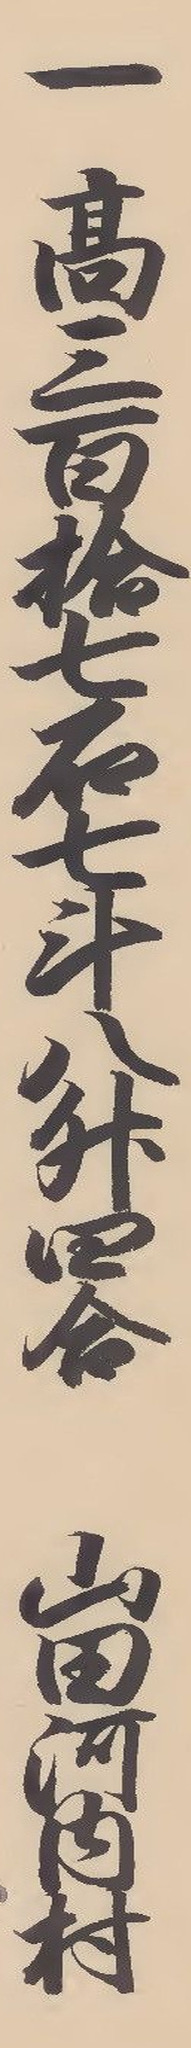一高三百拾七石七斗八升四合山田河内村
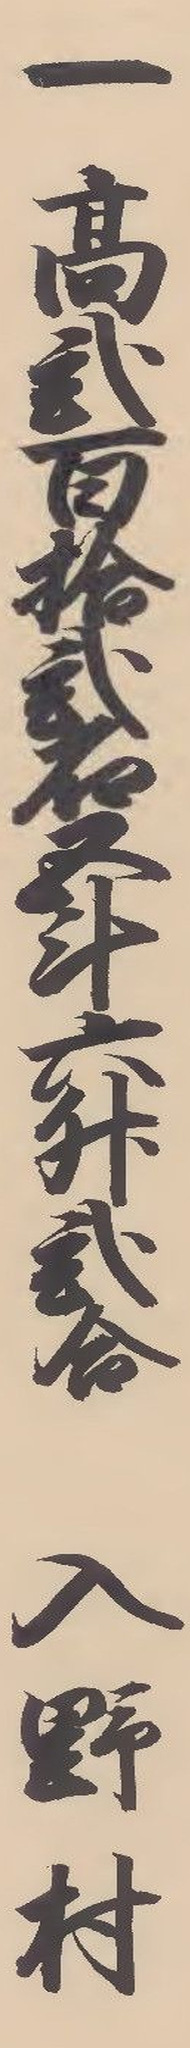一高弐百拾弐石五斗六升弐合入野村
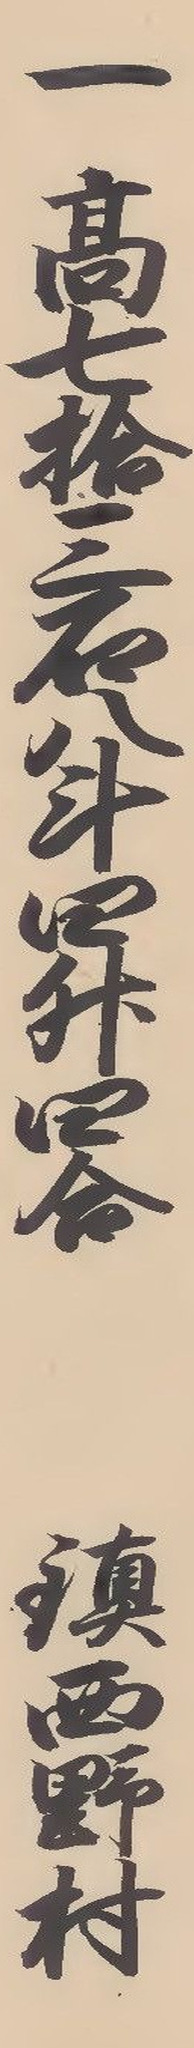一高七拾三石八斗四升四合鎮西野村
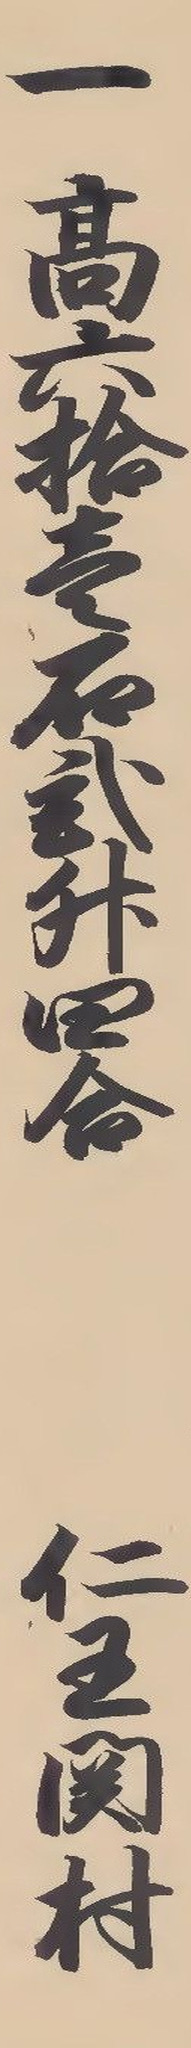一高六拾壱石弐升四合仁王関村
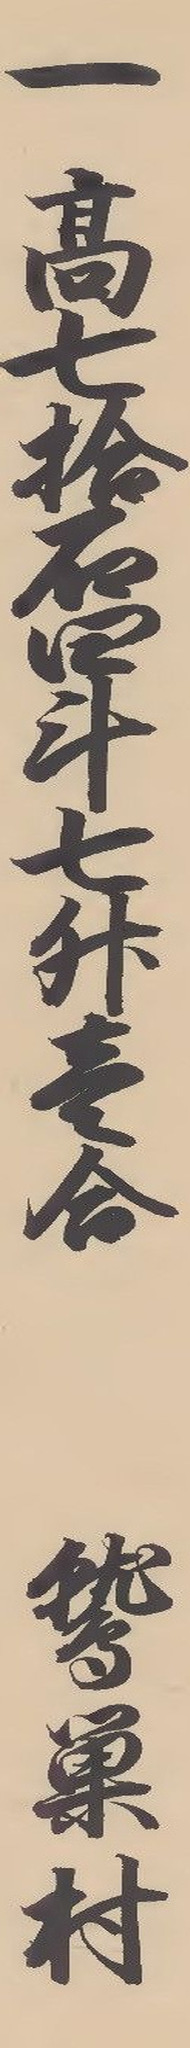一高七拾石四斗七升壱合鷲巣村
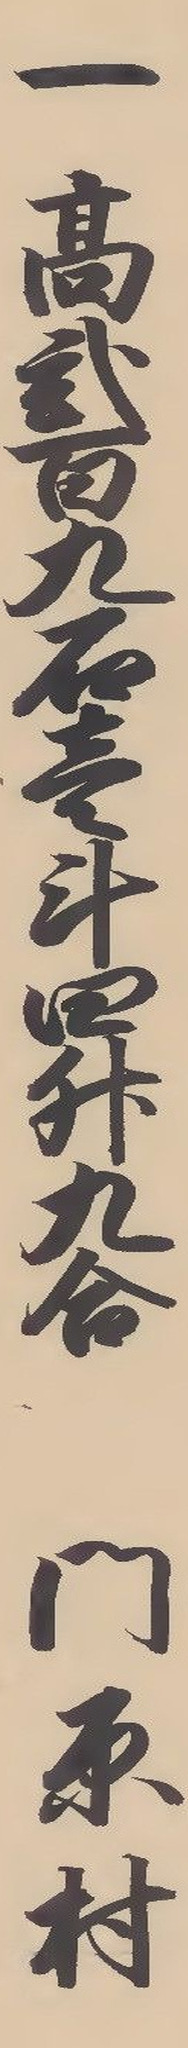一高弐百九石壱斗四升九合門原村
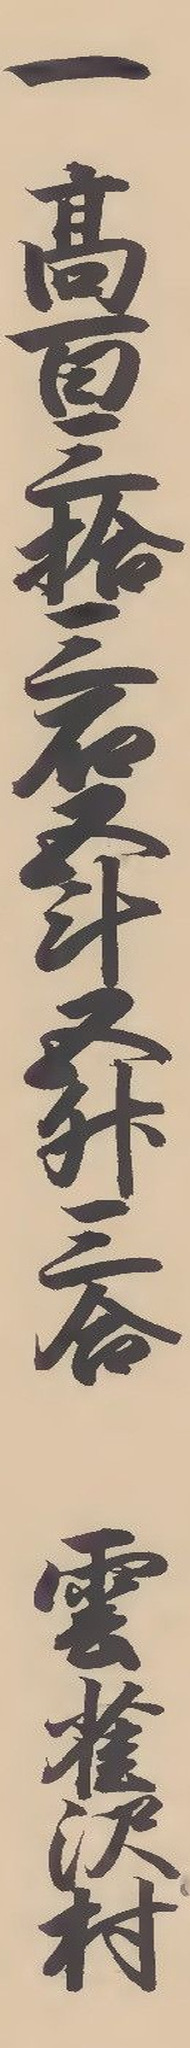一高百三拾三石五斗五升三合雲雀沢村

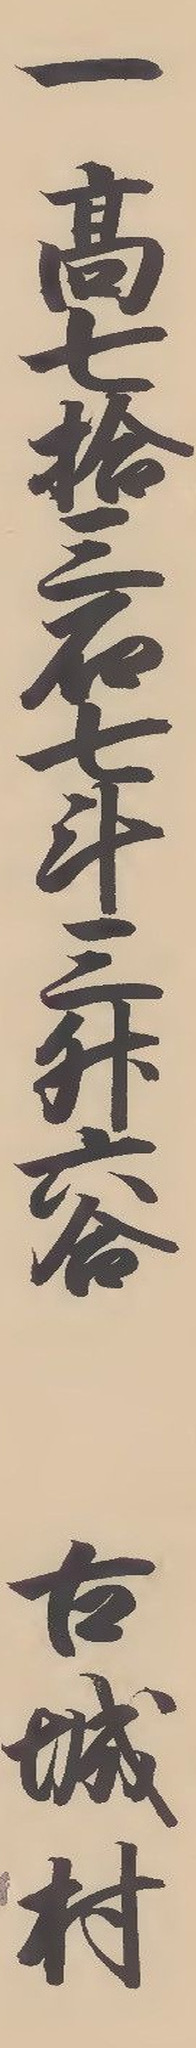一高七拾三石七斗三升六合古城村
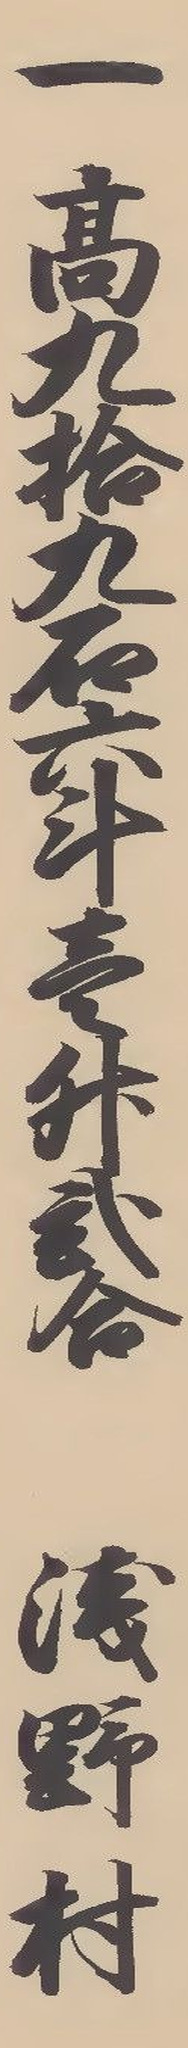一高九拾九石六斗壱升弐合浅野村
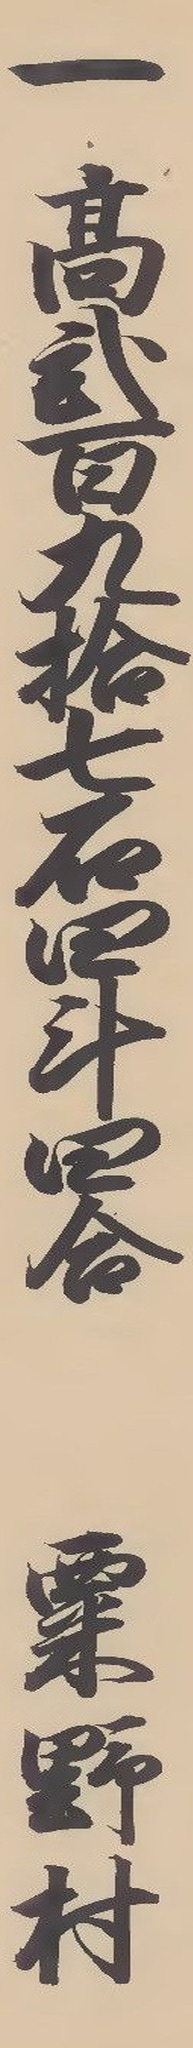一高弐百九拾七石四斗四合粟野村
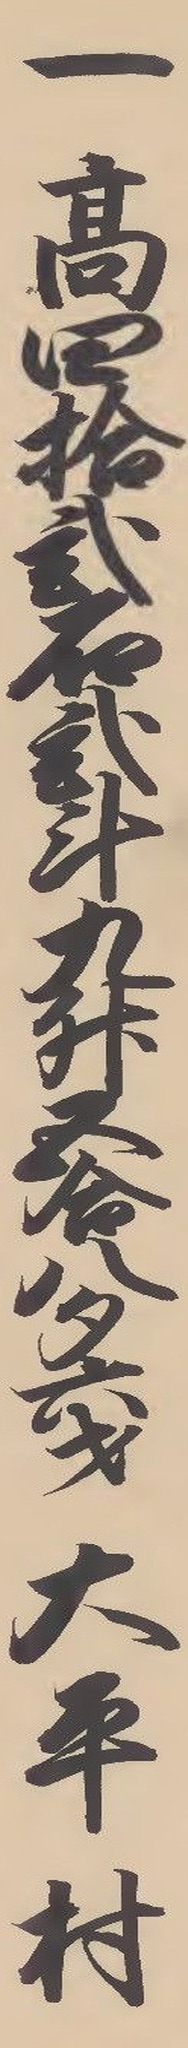一高四拾弐石弐斗九升五合八勺六才大平村
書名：信濃国郷帳
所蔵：国立公文書館 National Archives of Japan
